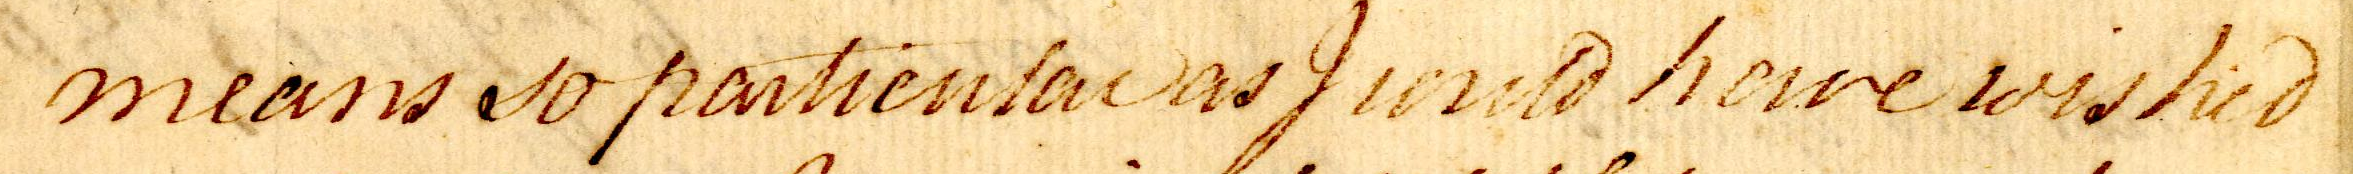means so particular as I could have wished
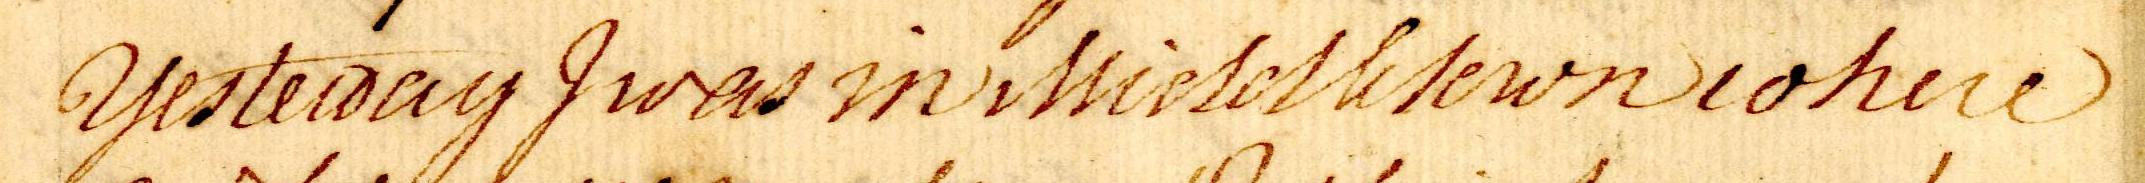Yesterday I was in Mictothtown to here
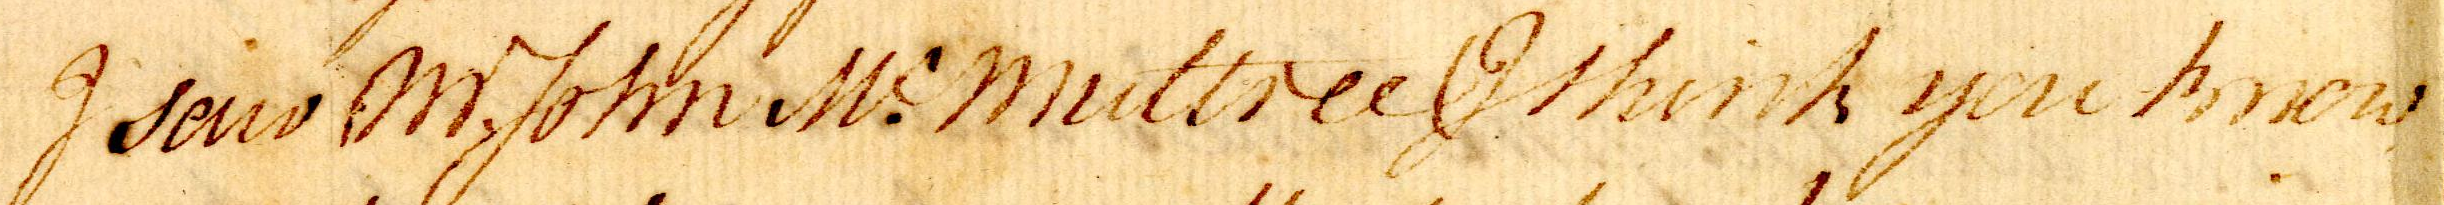I saw M^r John M^cMuttree (I think you know
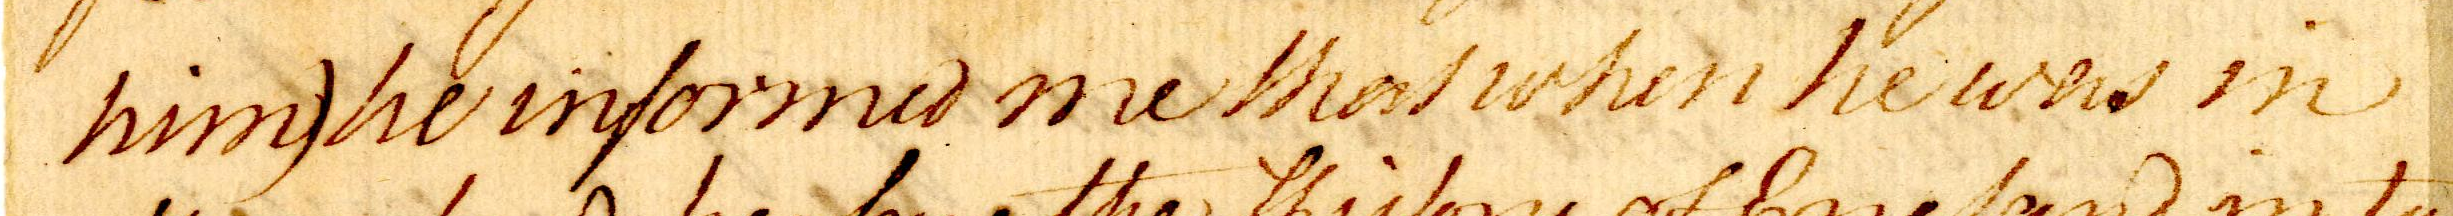him) he informed me that when he was in
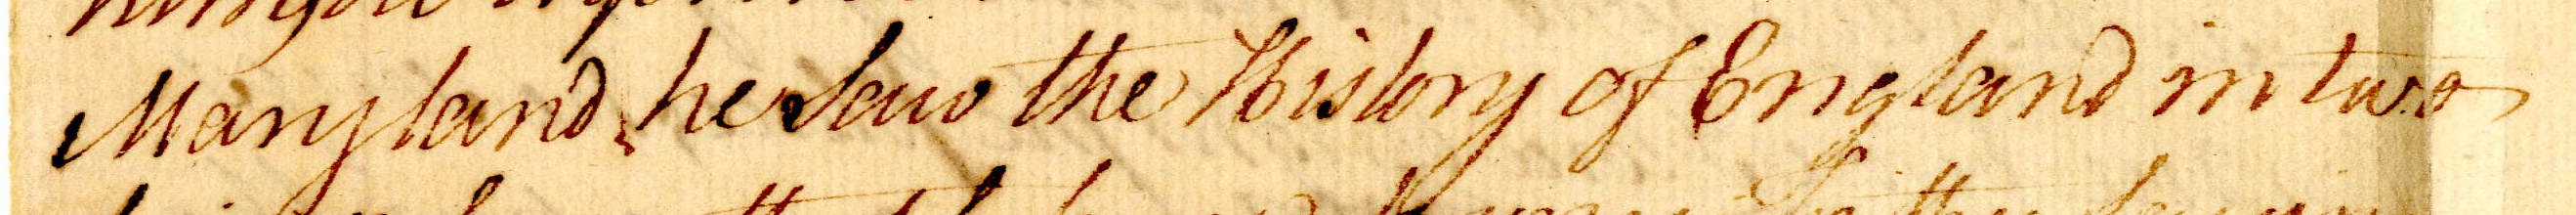Maryland he Saw the History of England in two
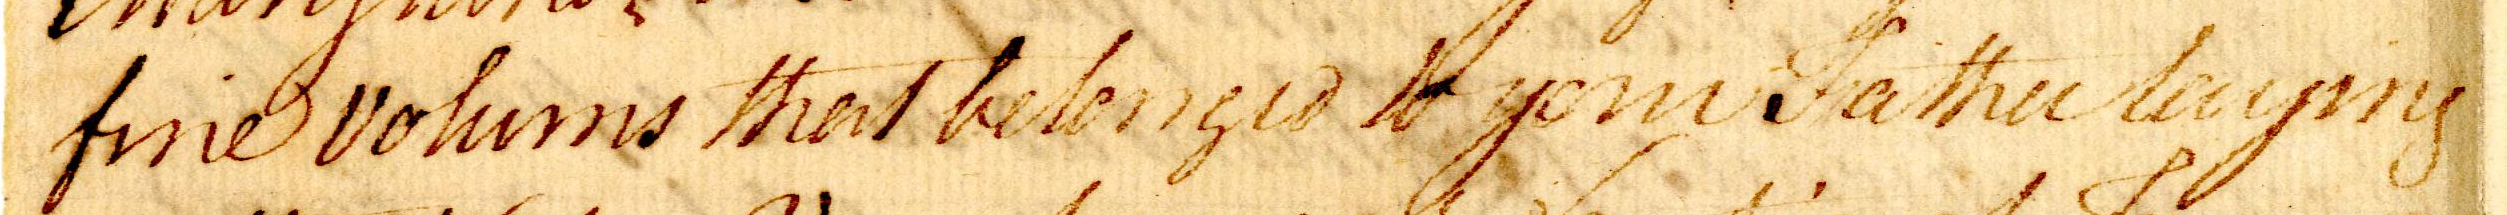fine volums that belonged to your Father laying
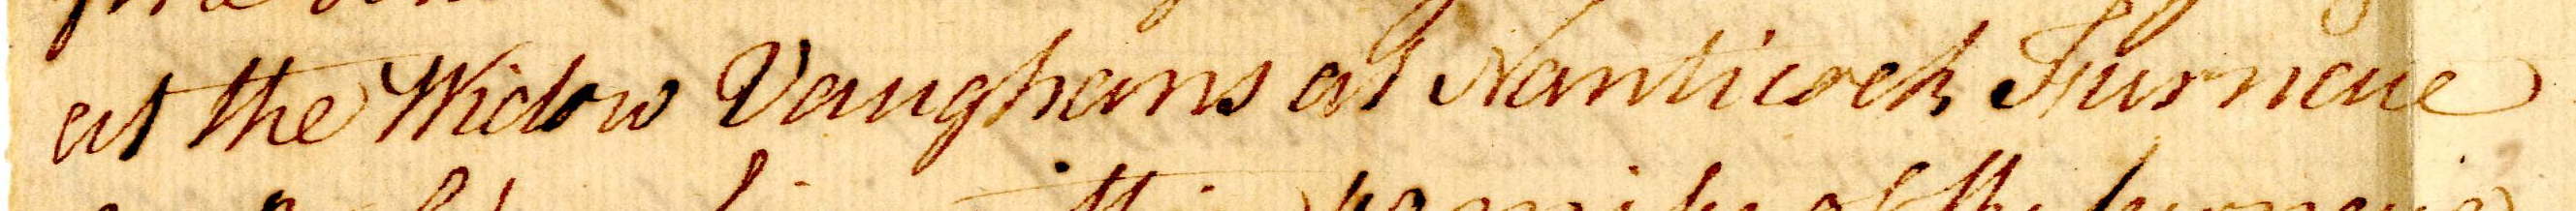at the Widow Vaughans at Nanticock Furnicue
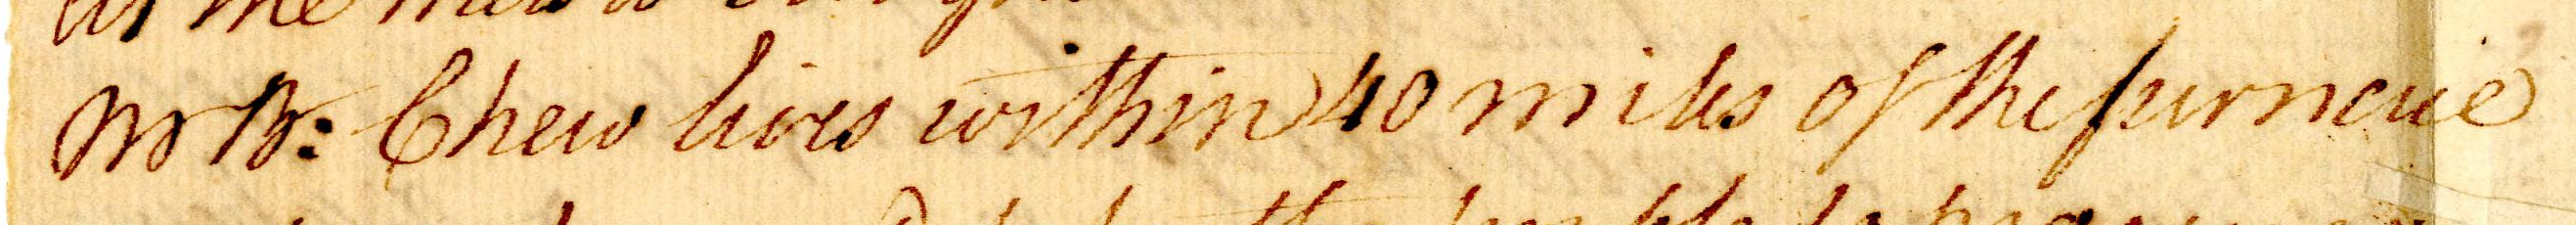M. B: Chew lives within 10 miles of the Furncue
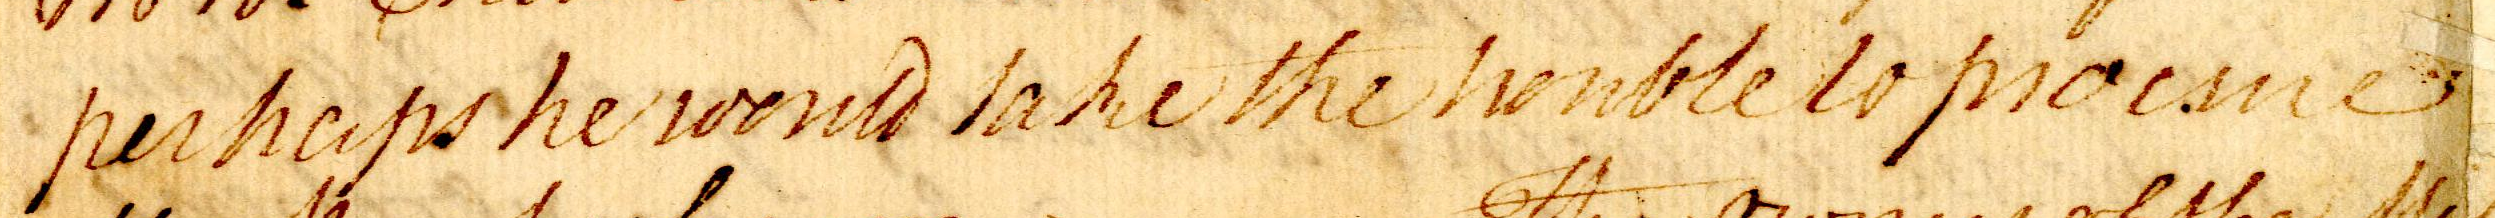perhaps he would take the honble to procure
